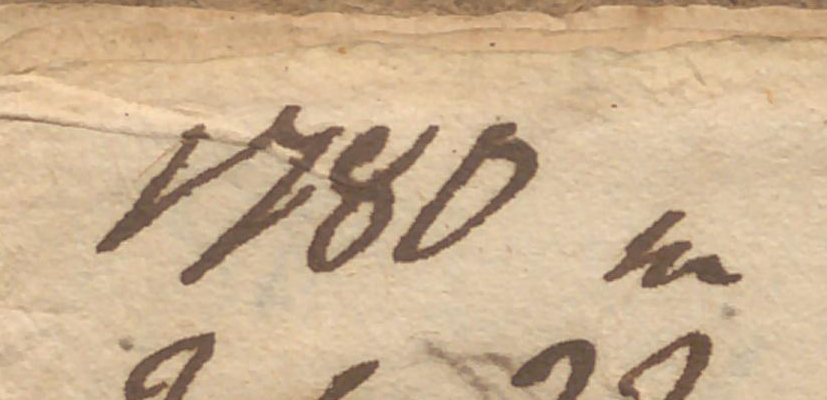1780
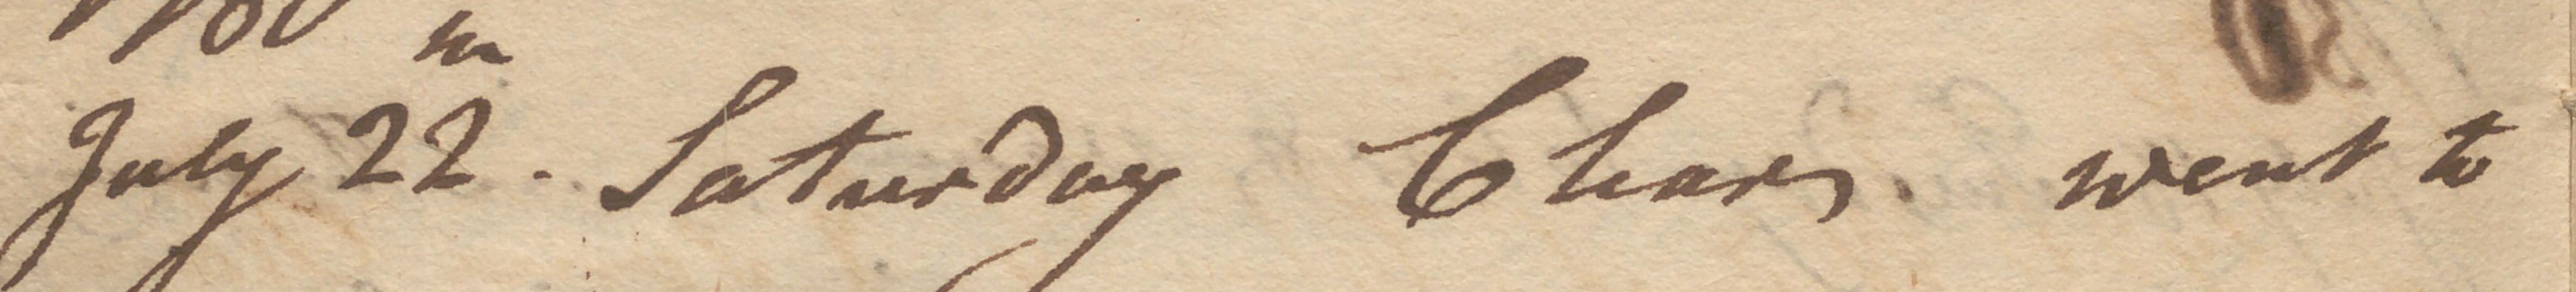July 22^th. Saturday Clear went to
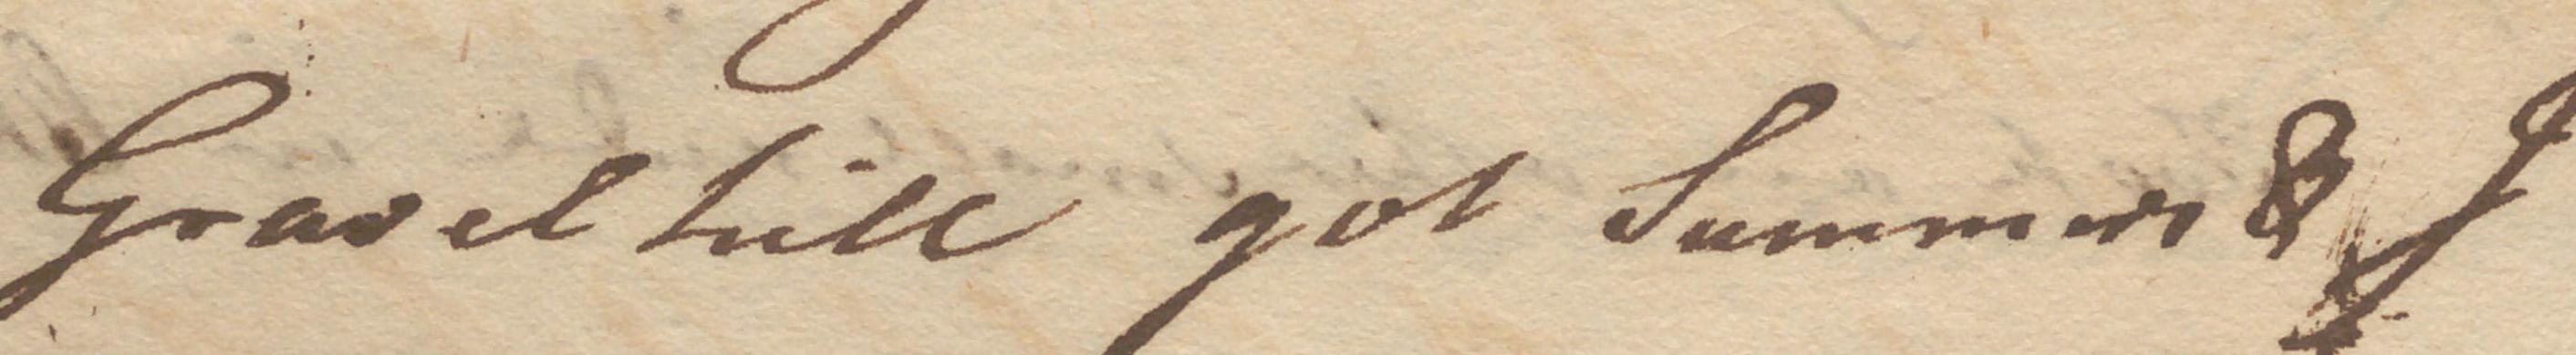eravel hill got Summers & I
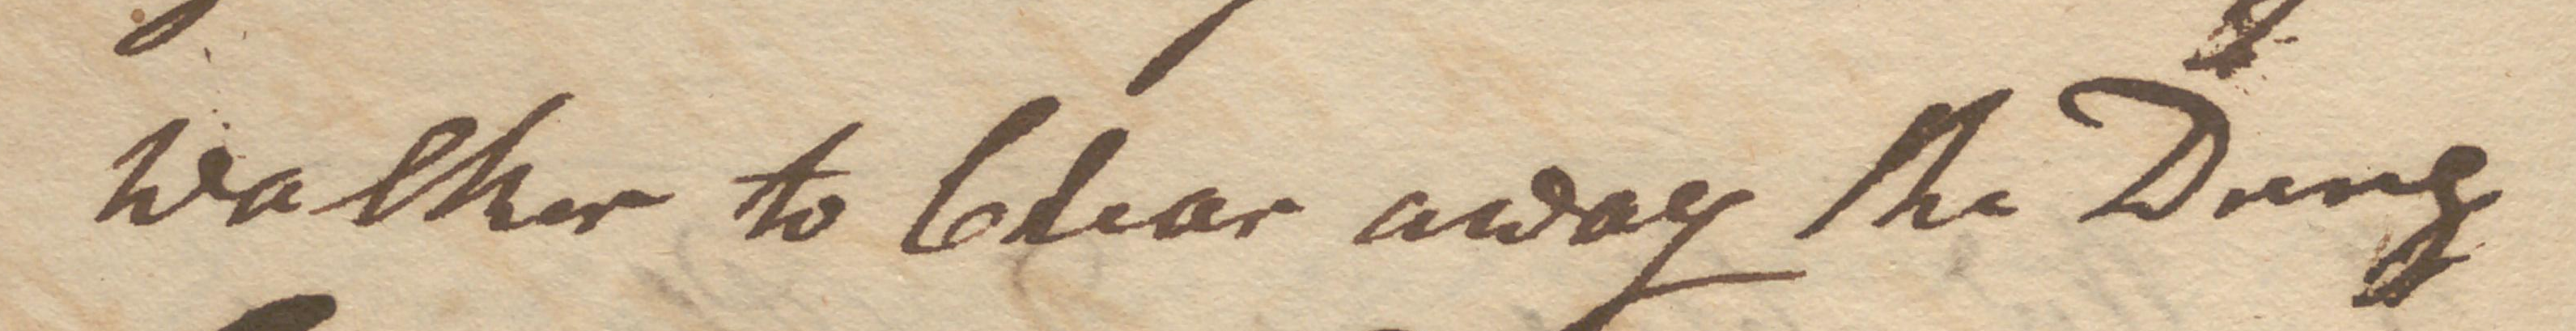walker to Clear away the Dung
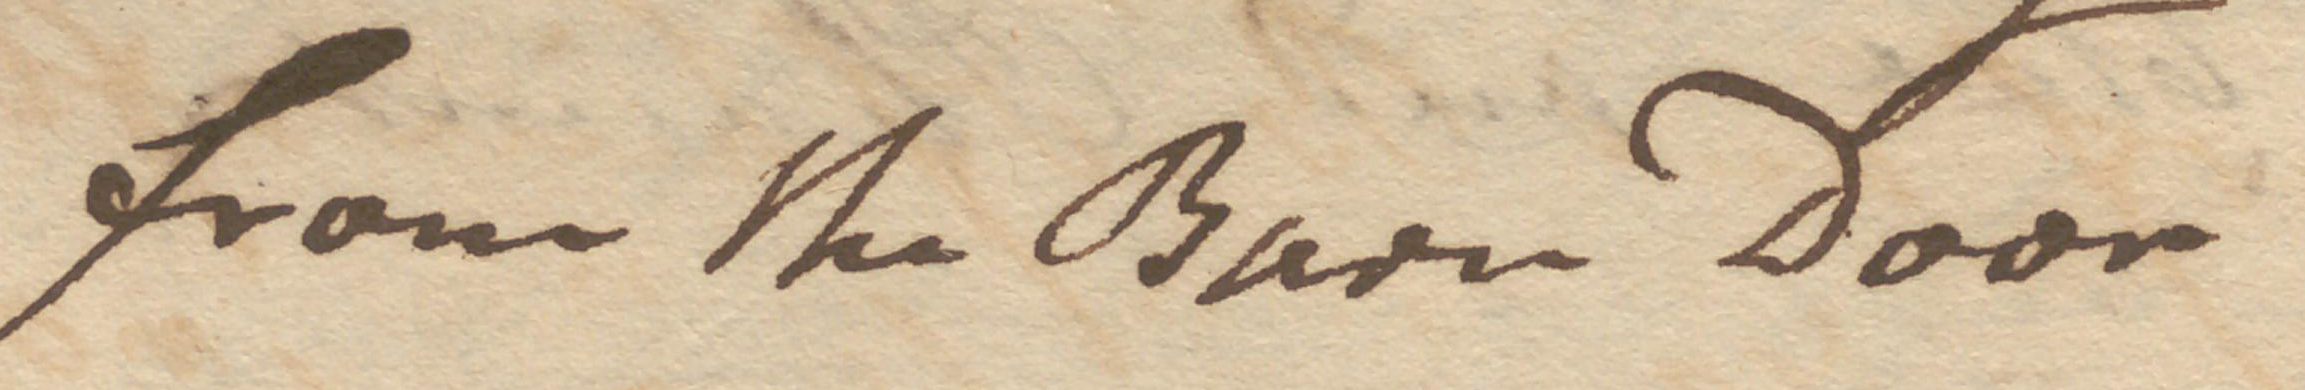from the Barn Door
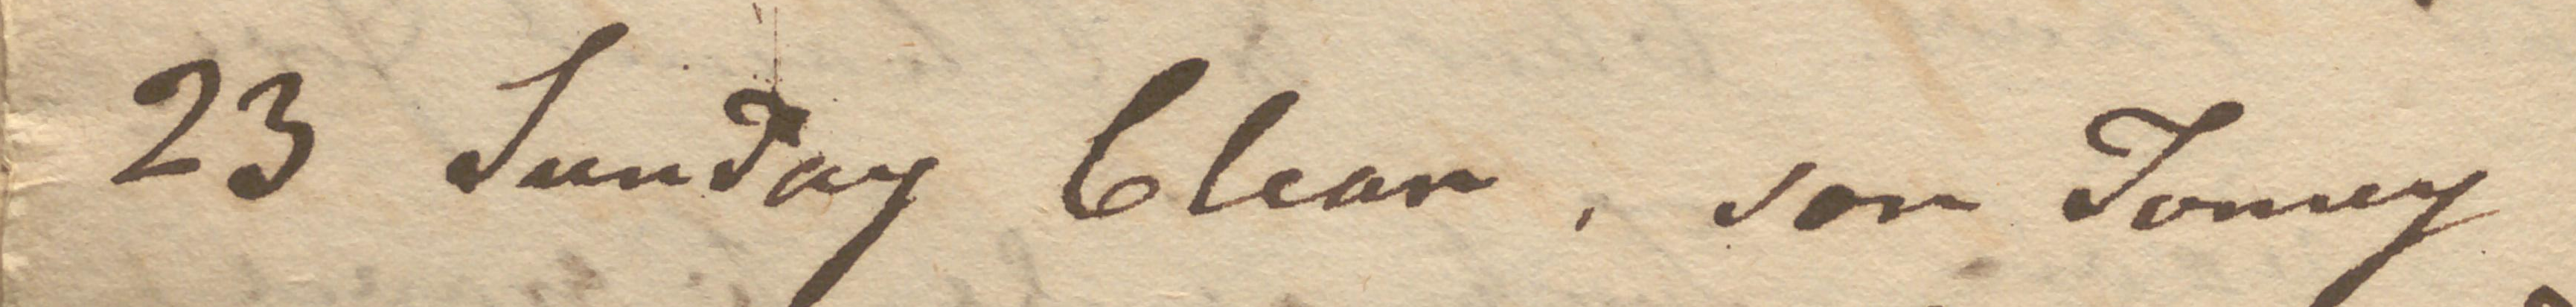23 Sunday Clear, son Tomey
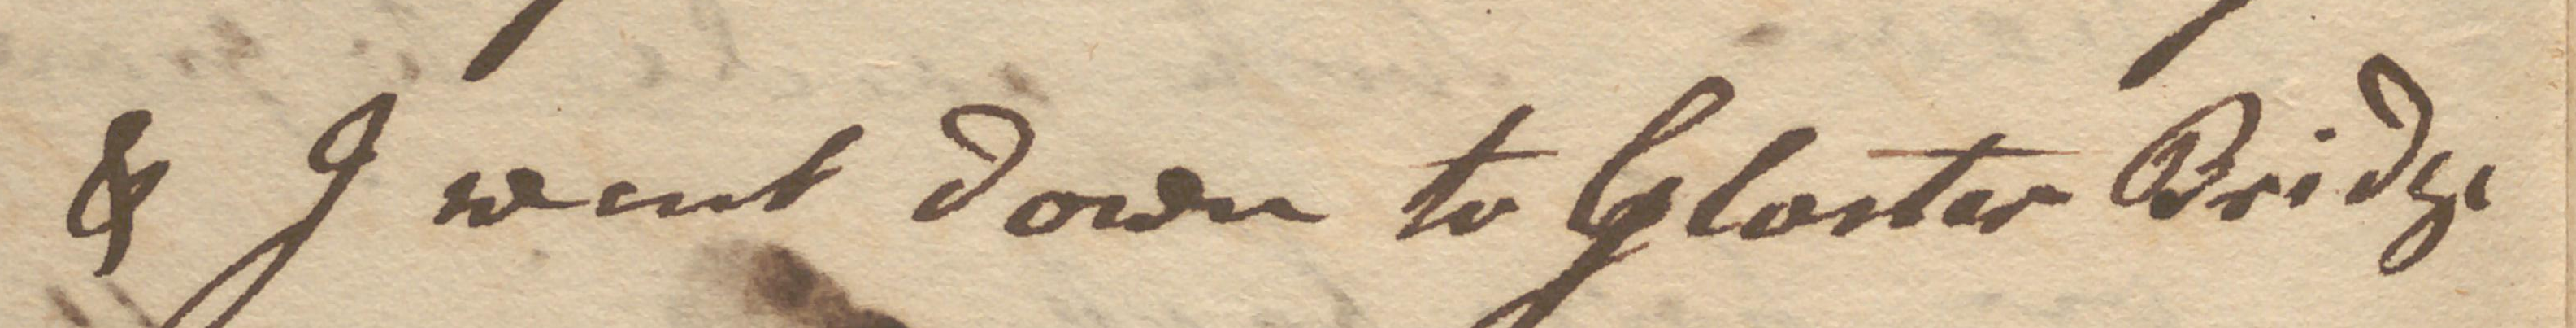& I went down to Glaster Bridge.
